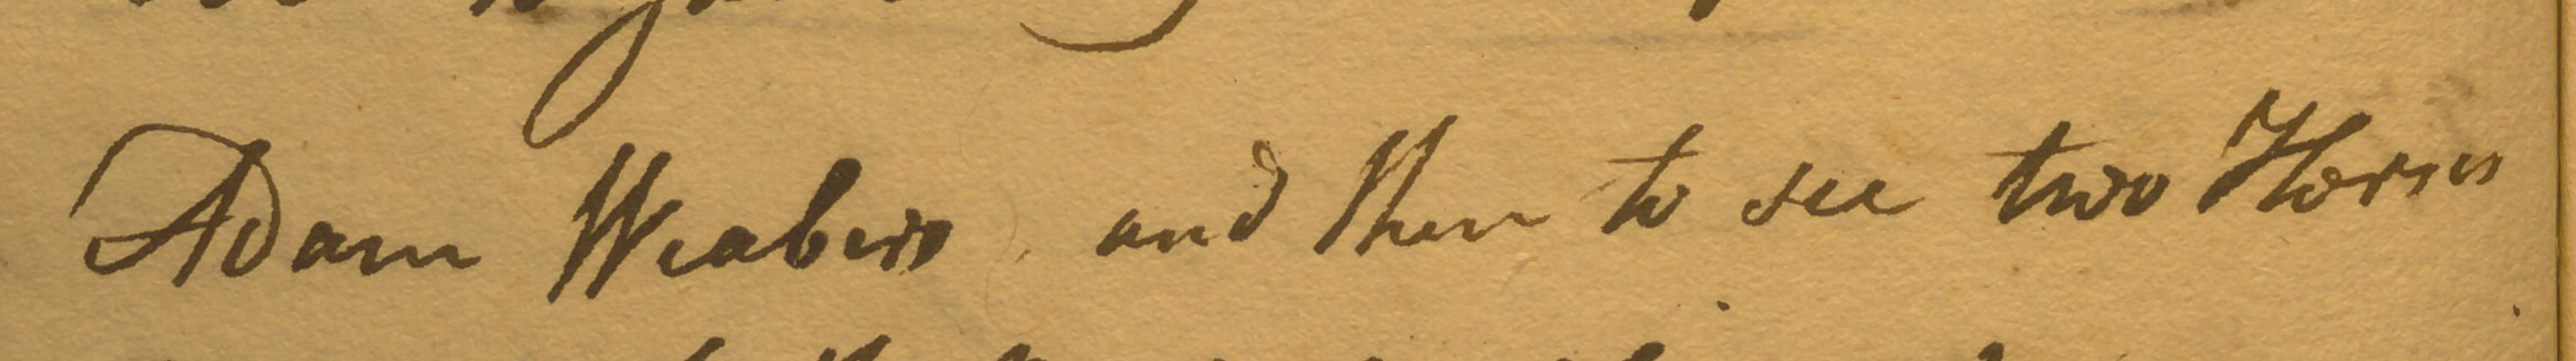Adam Weabers, and then to see two Horses
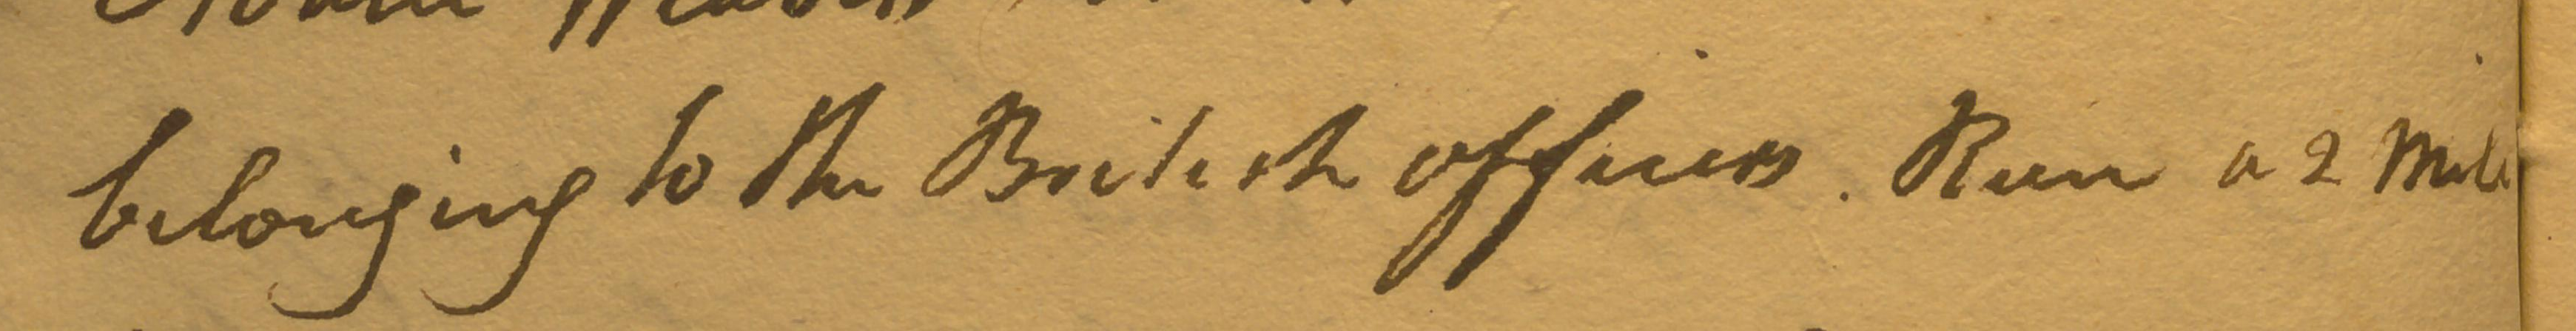belonging to the British officers. Run a 2 Mile
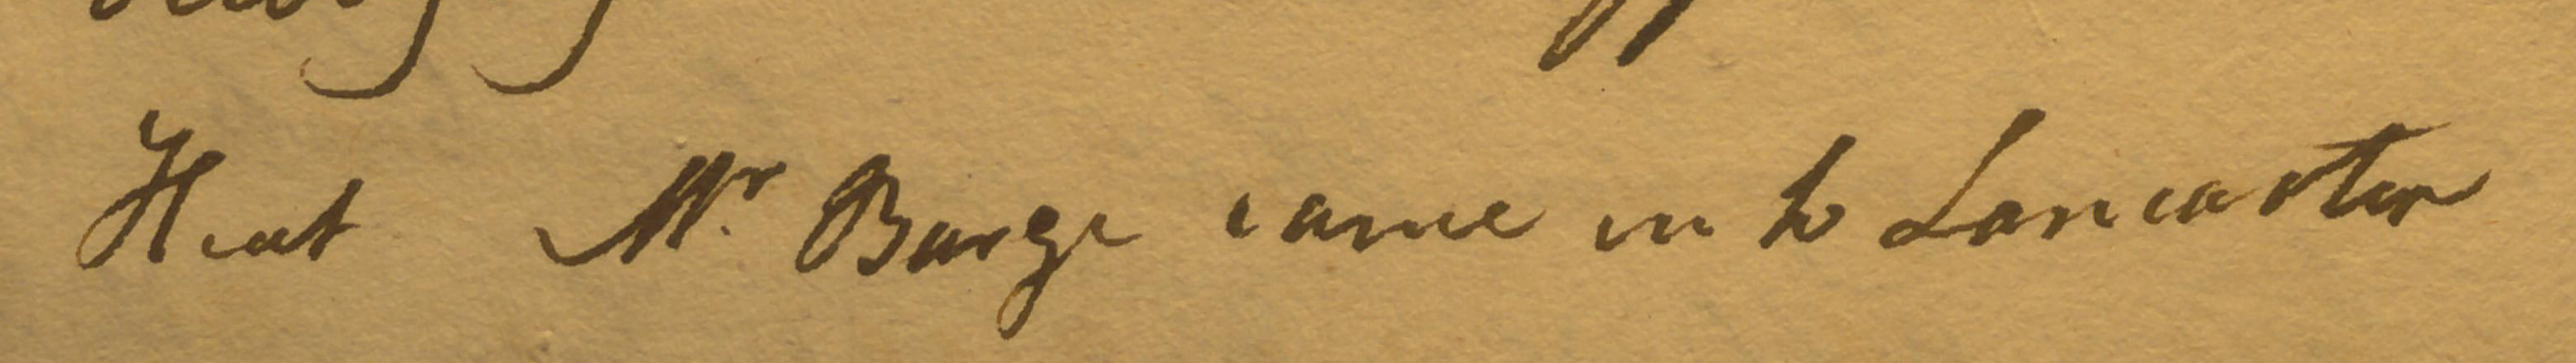Heat M^r. Barge came in to Lancarter
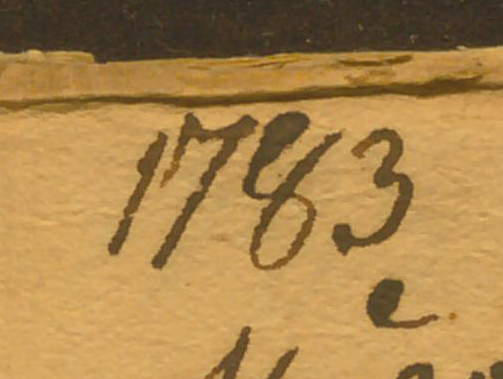1783
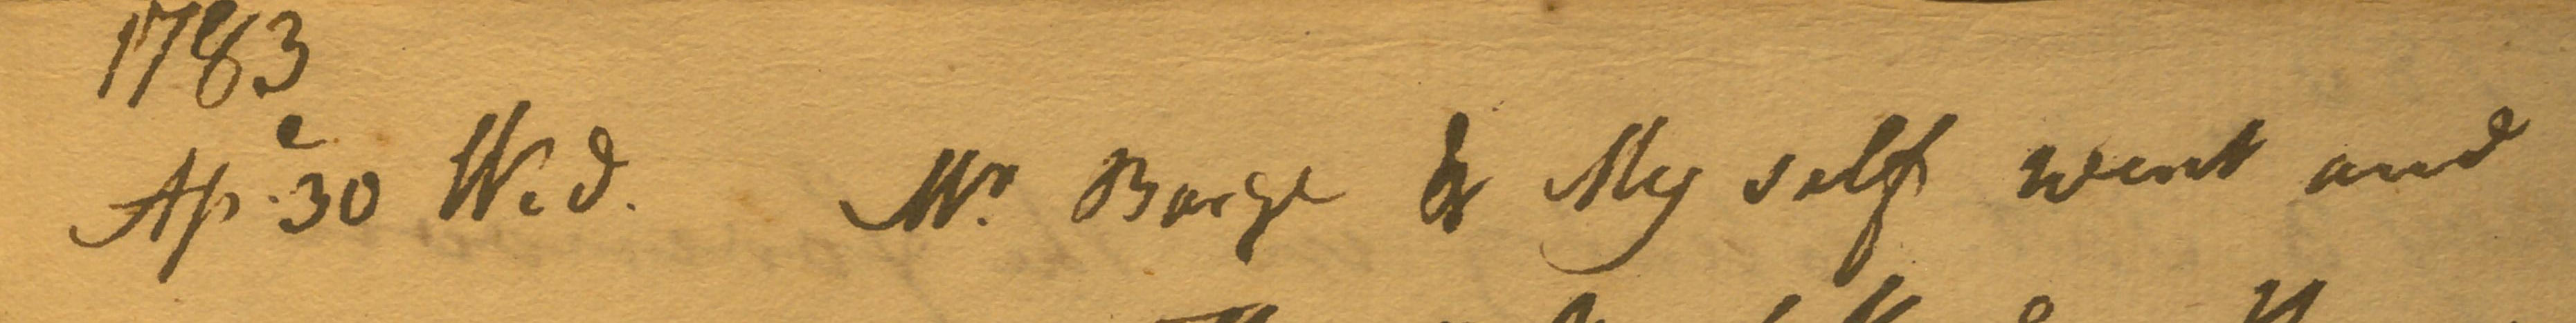Ap^l 30 Wed. M^r. Barge & My self went and
